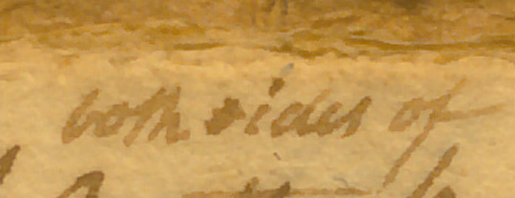both sides of
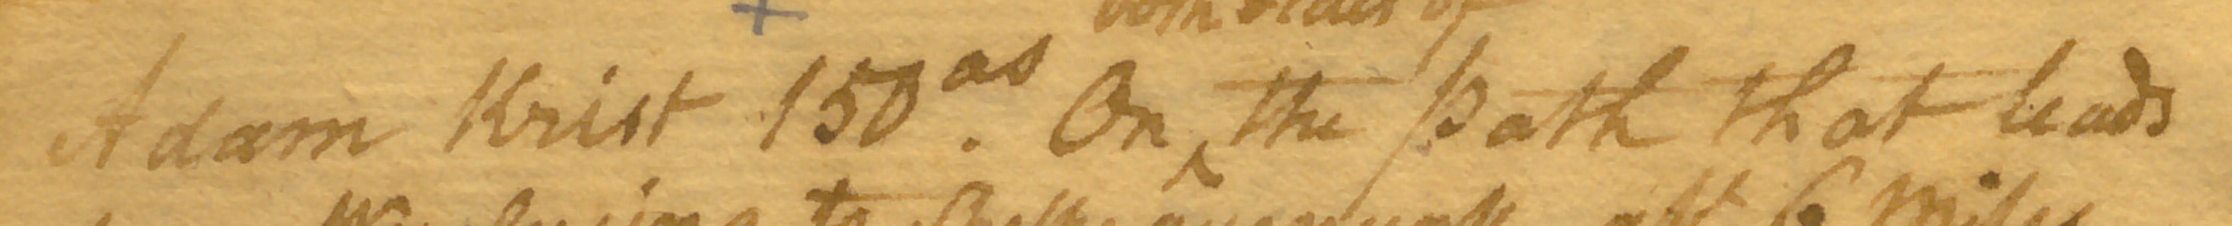Adam Krist 150^as. on ^ the path that leads
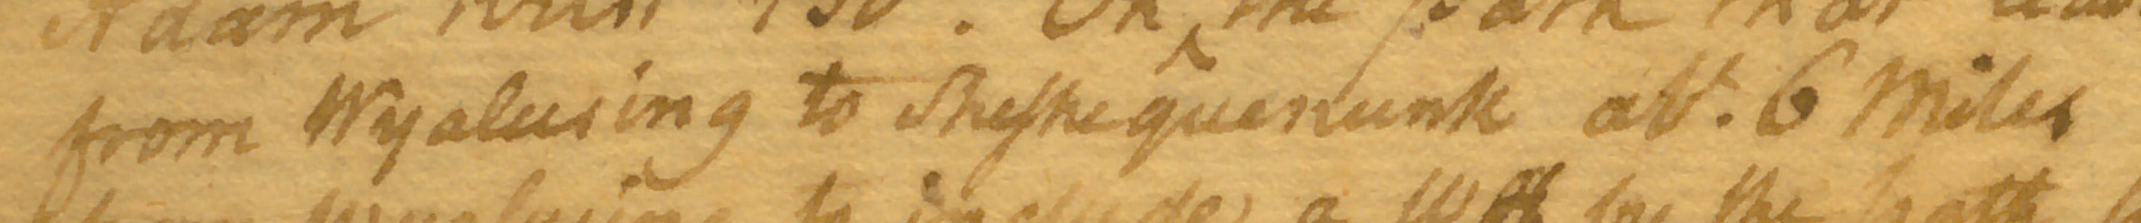from Wyalusing to Sheshequenunk ab^t. 6 miles
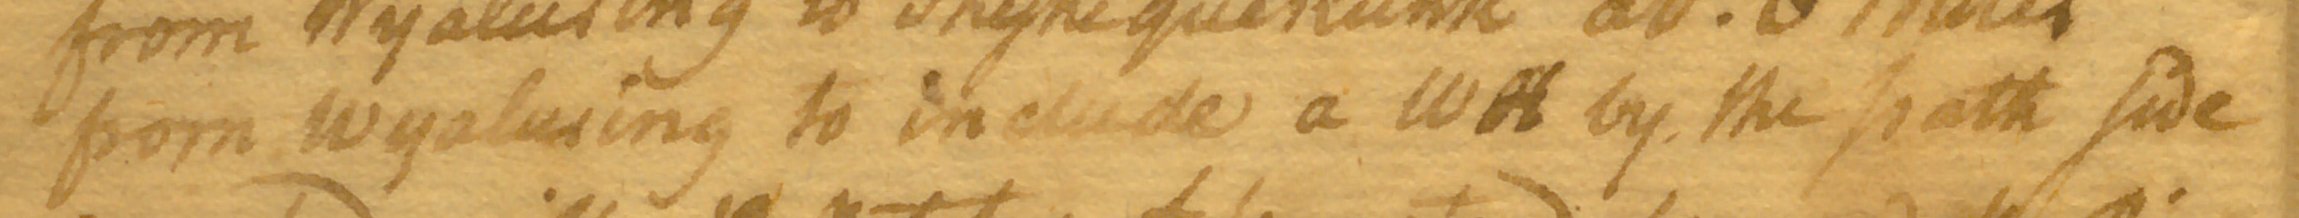from Wyalusing to include a WH by the path side
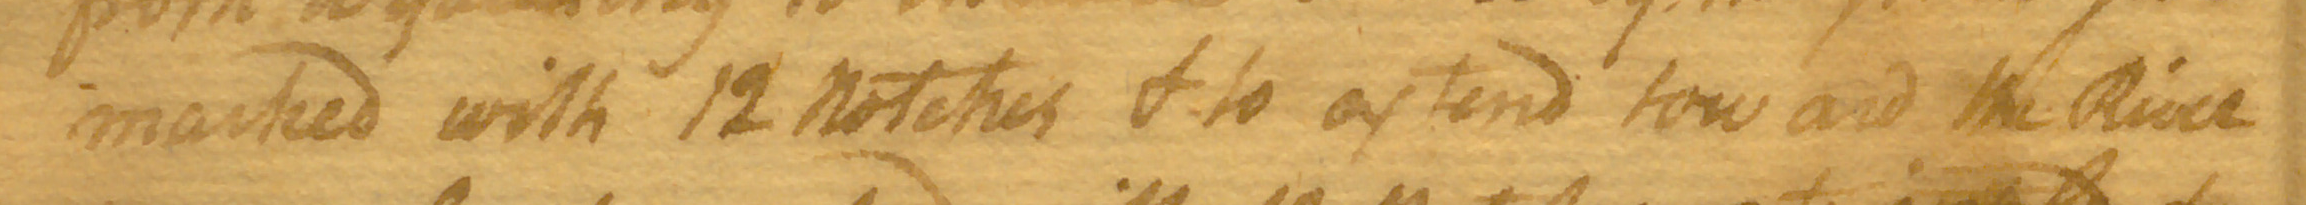marked with 12 notches & to extend toward the River
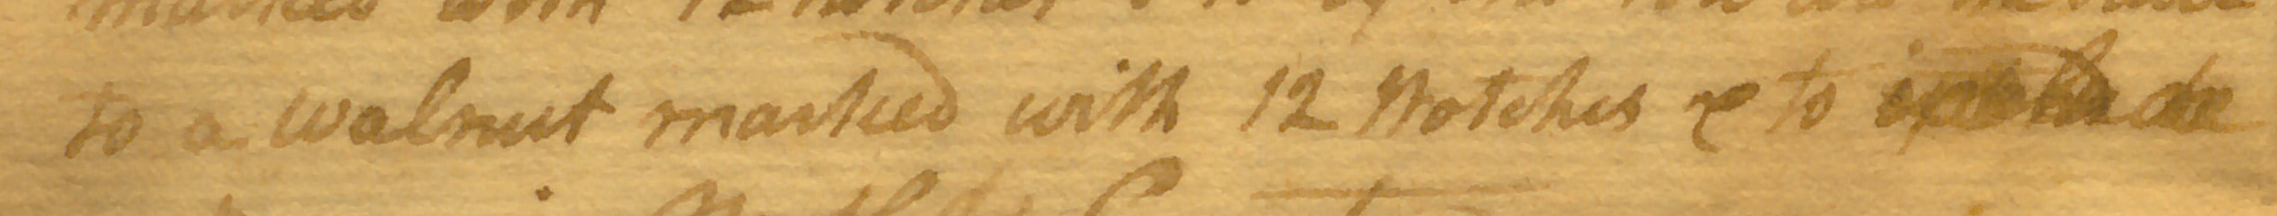to a walnut marked with 12 notches & to
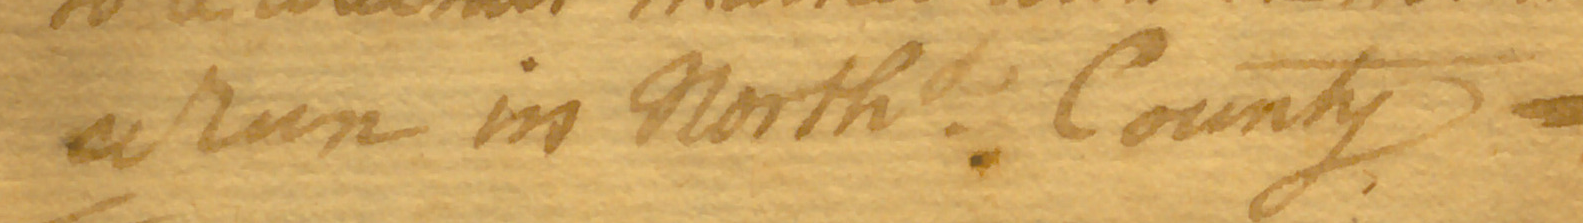a run in North^d. County-
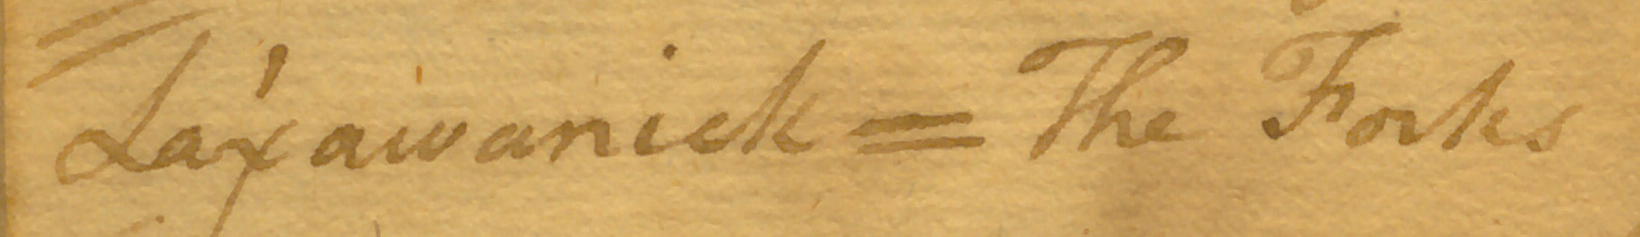Láxawanick = The Forks
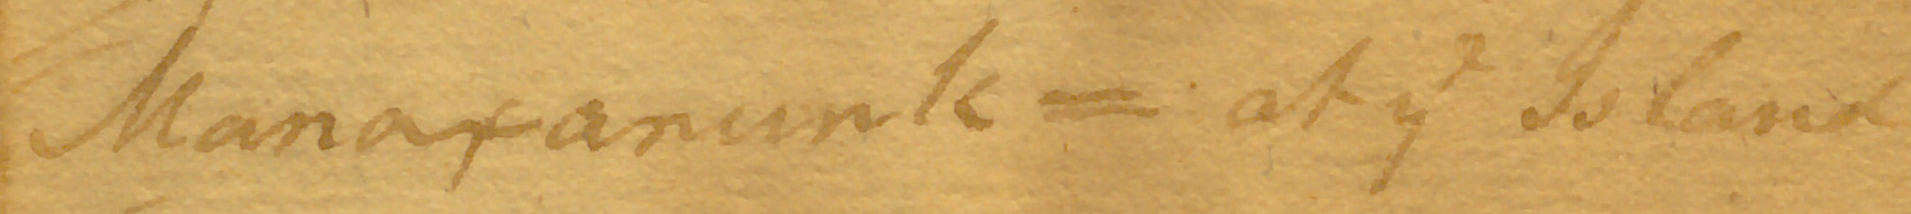Manaxanuck = at y^e Island
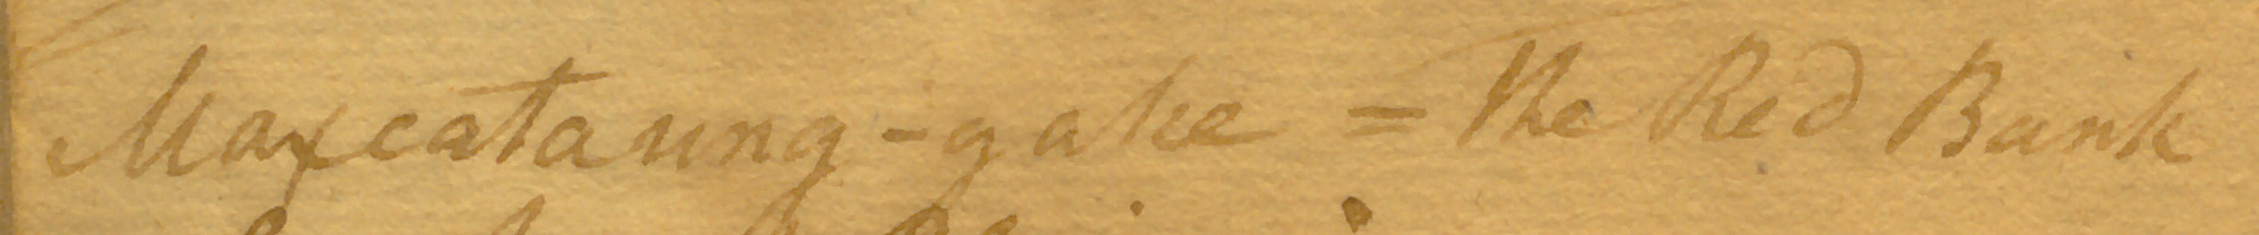Maxcataung-gake = the Red Bank
